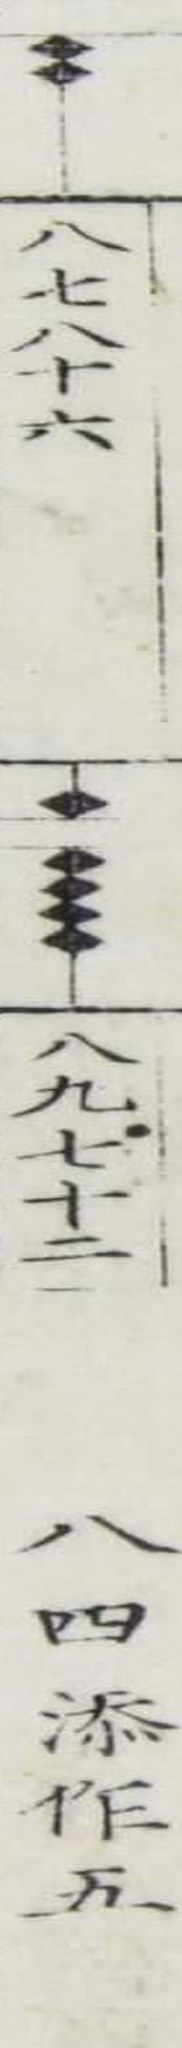八七．八十六
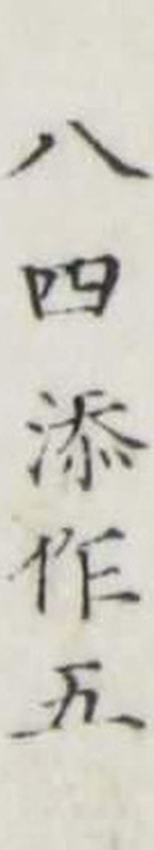八四添作五
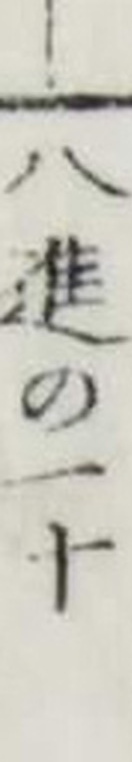八進の一十
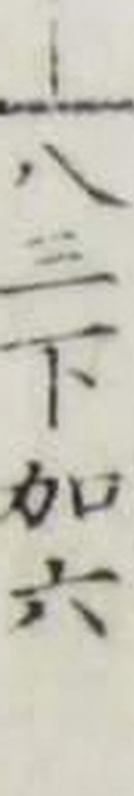八三下加六
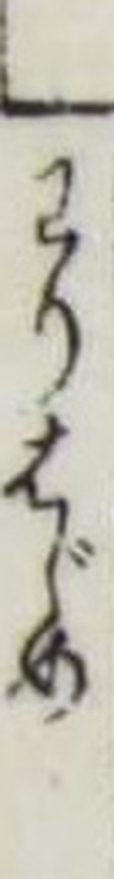わりはじめ
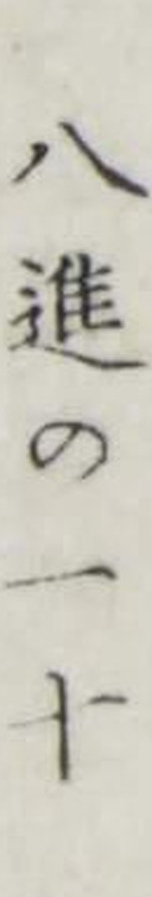八進の一十

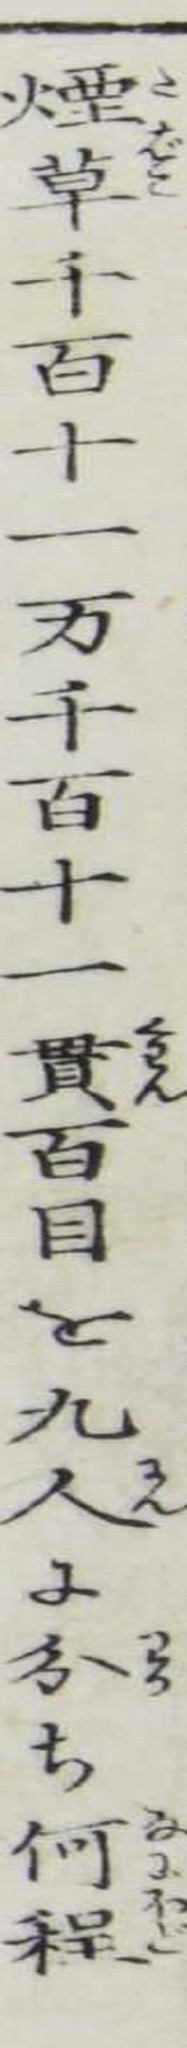煙草千百十一万千百十一貫百目を九人に分ち何程
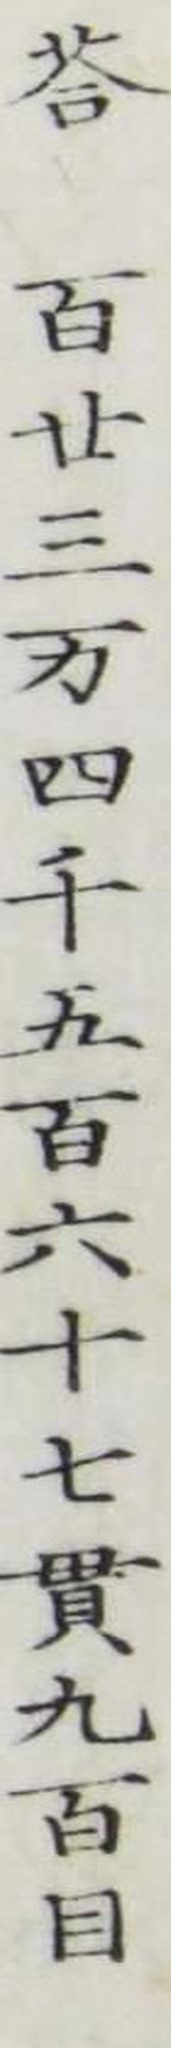答百廿三万四千五百六十七貫九百目
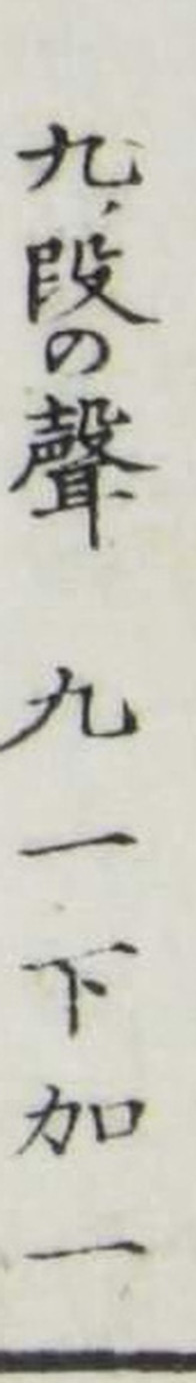九ノ段の声九一下加一
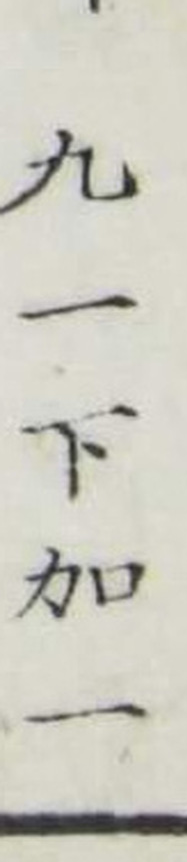九二下加二
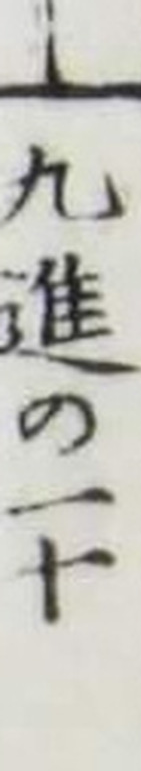九進の一十
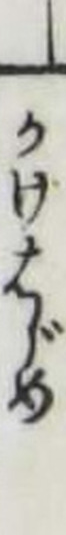わりはじめ
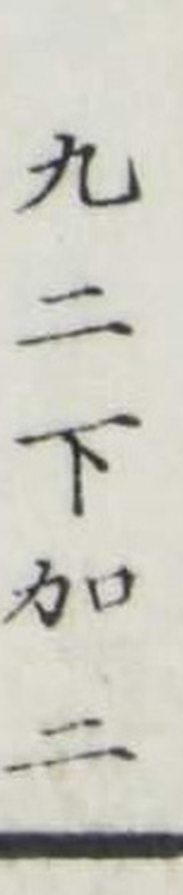九二下加二
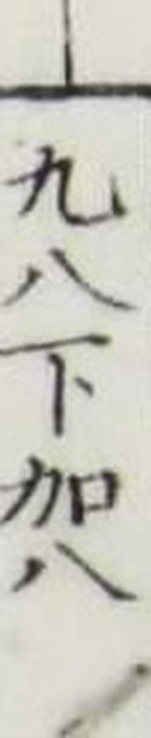九八下加八
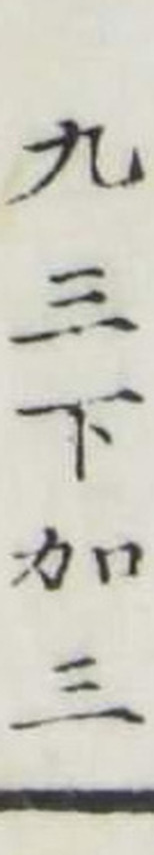九三下加三
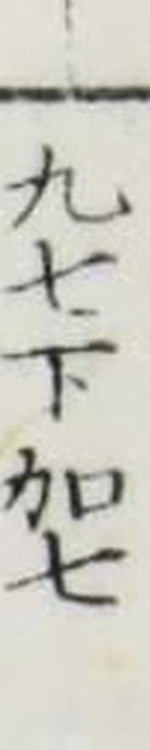九七下加七
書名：明治小學塵劫記 卷1
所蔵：東京学芸大学教育コンテンツアーカイブ
